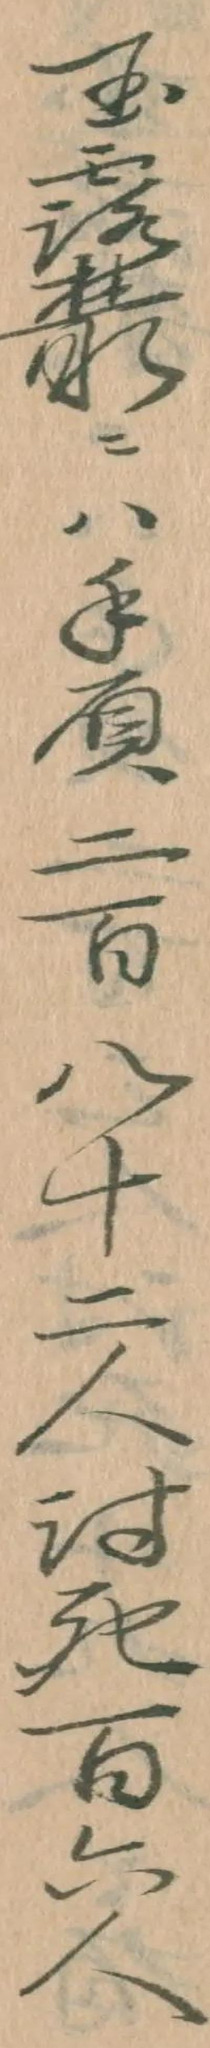玉露樷には手負二百八十二人討死百六人
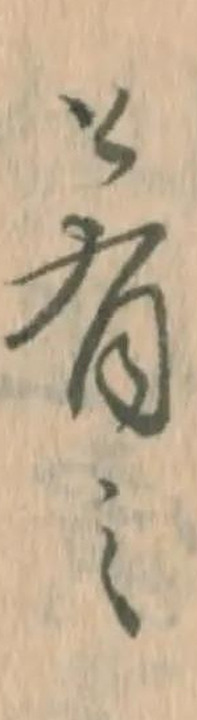と有之
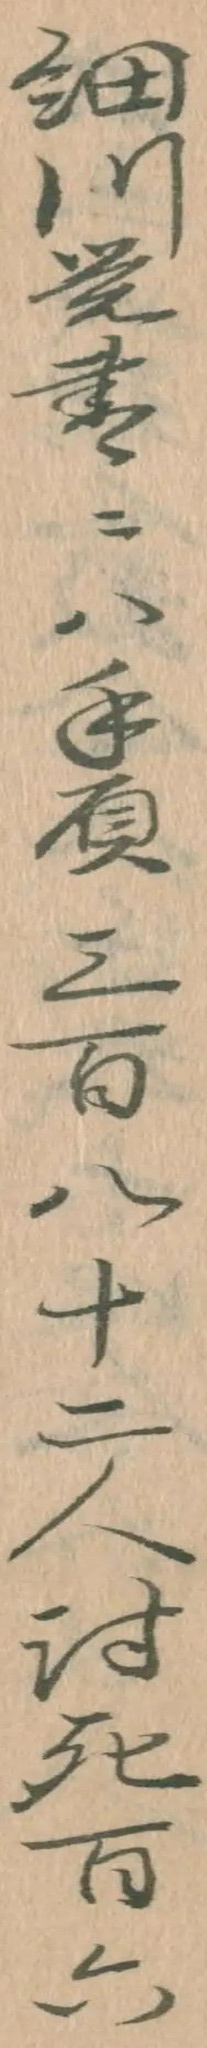細川覚書には手負三百八十二人討死百六
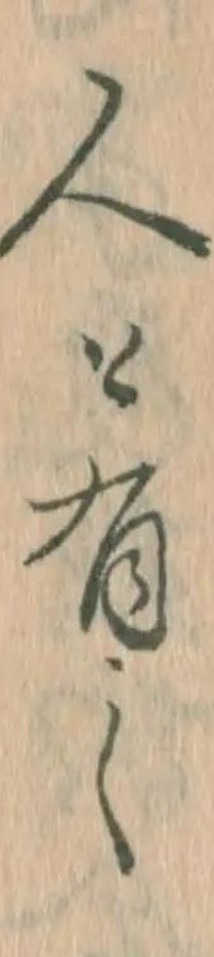人と有之
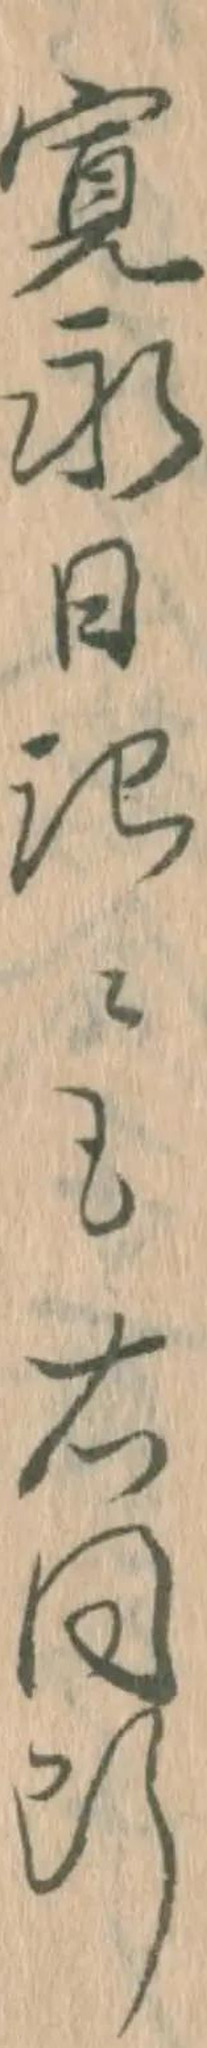寛永日記にも右同断
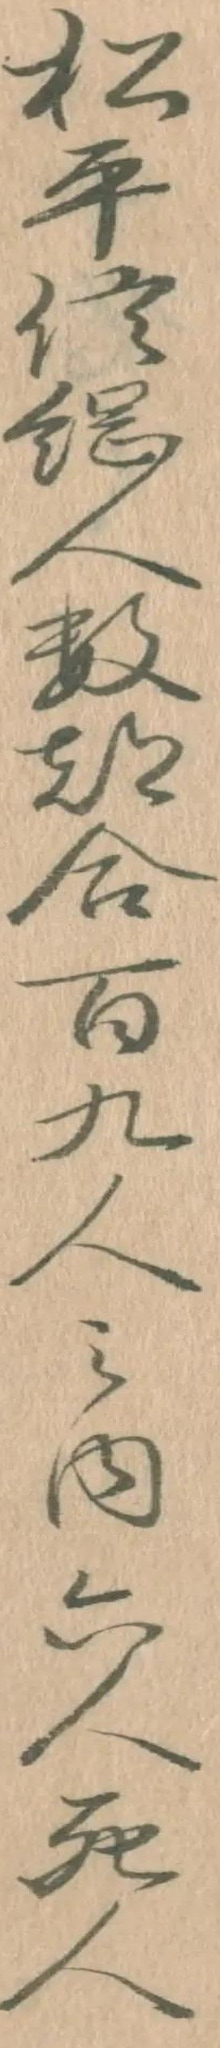松平信綱人数都合百九人之内六人死人
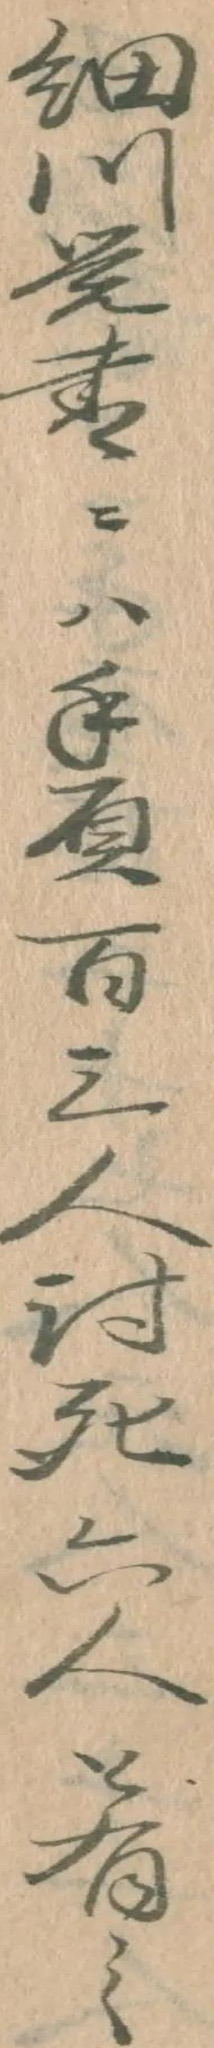細川覚書には手負百三人討死六人と有之
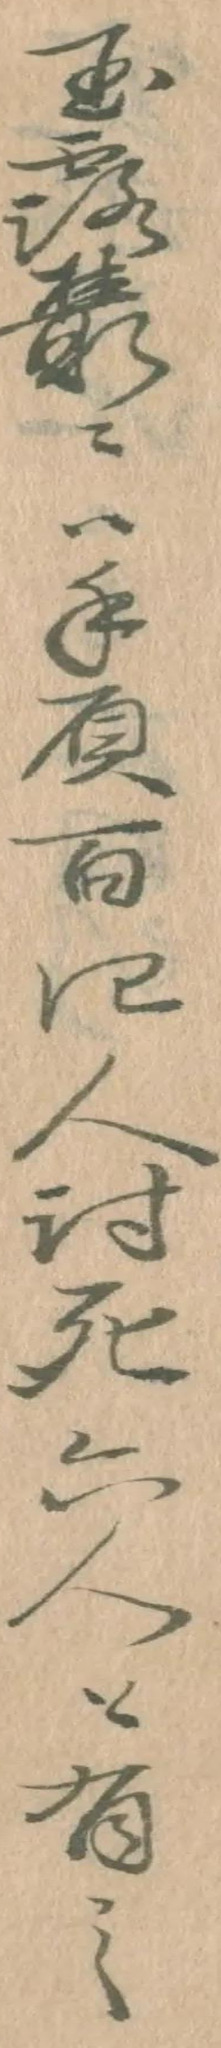玉露樷には手負百四人討死六人と有之
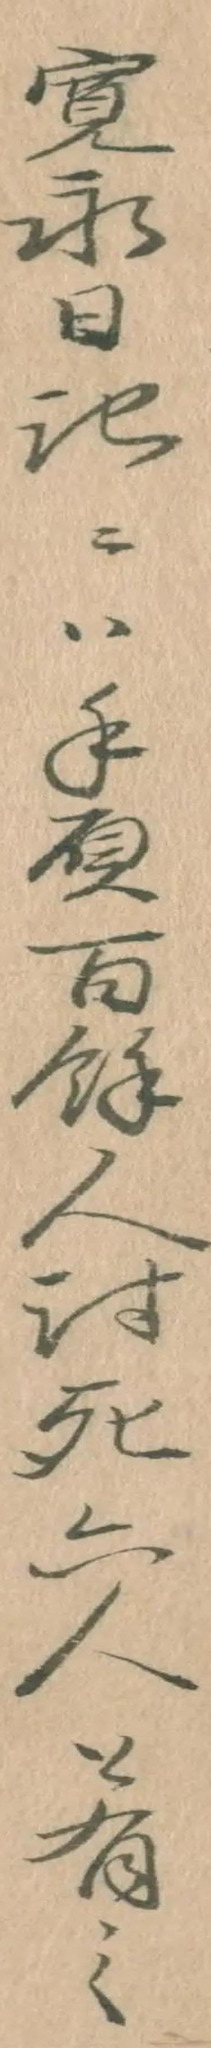寛永日記には手負百余人討死六人と有之
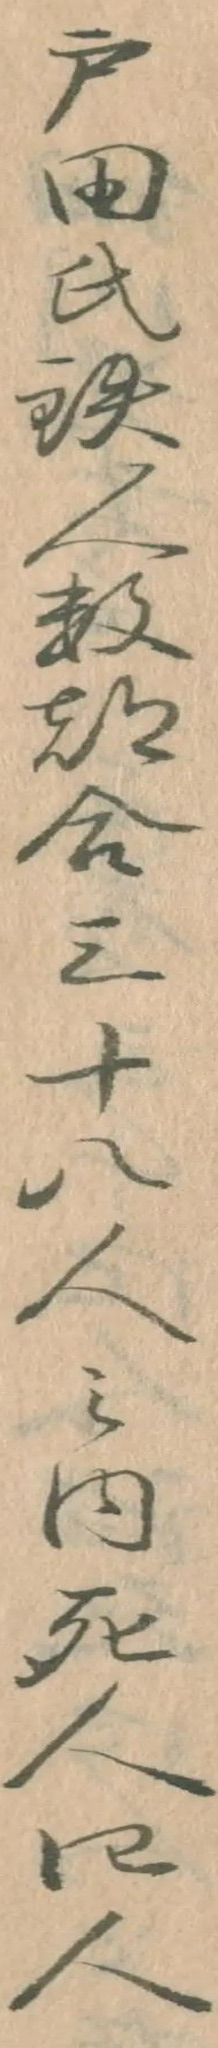戸田氏鉄人数都合三十八人之内死人四人
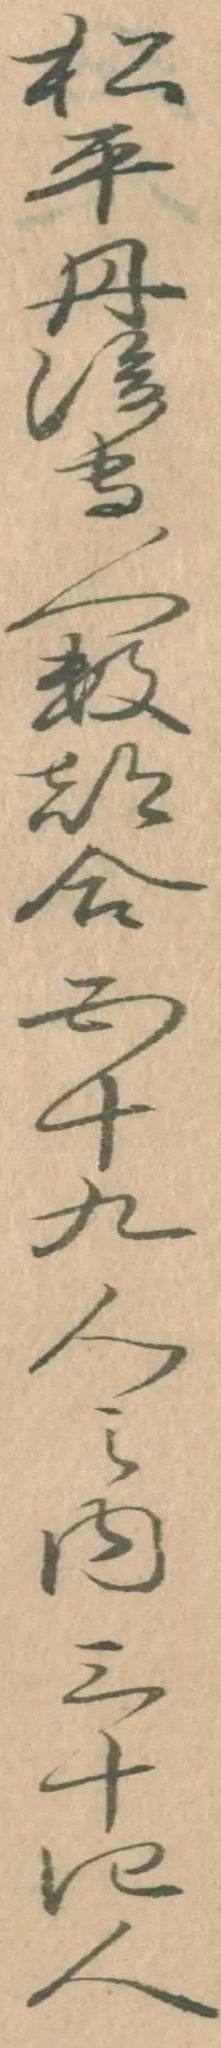松平丹後守人数都合五十九人之内三十四人

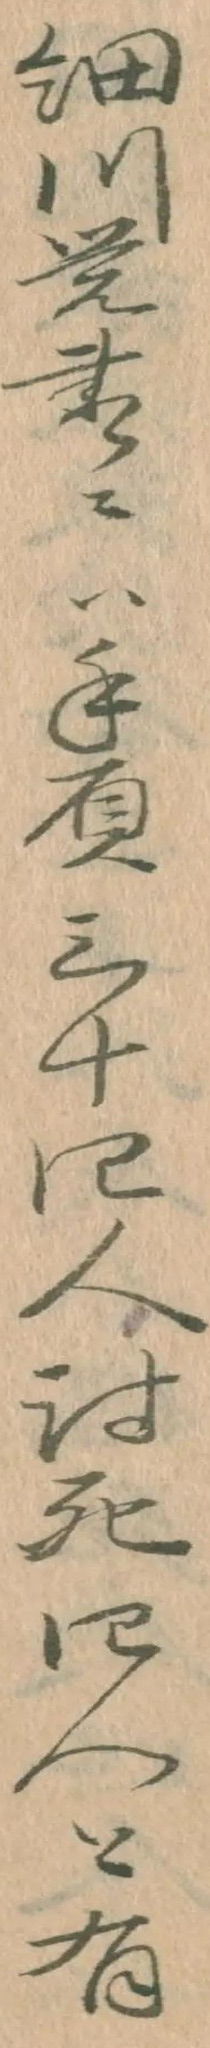細川覚書には手負三十四人討死四人と有
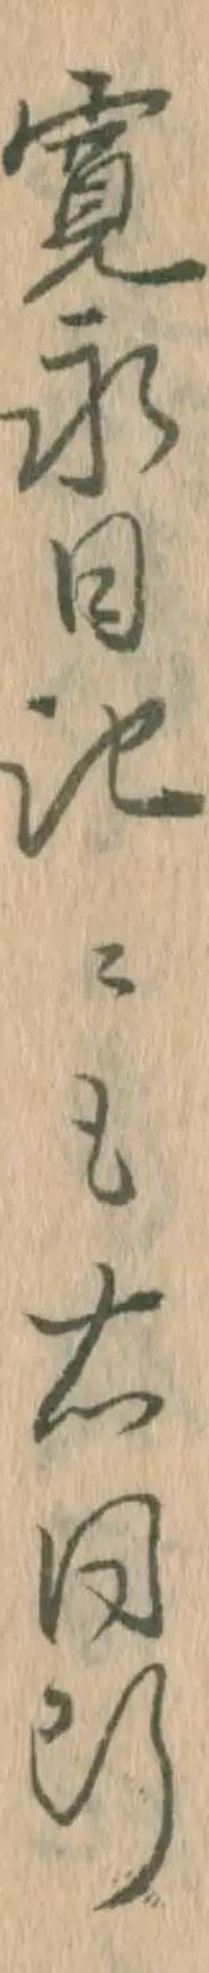寛永日記にも右同断
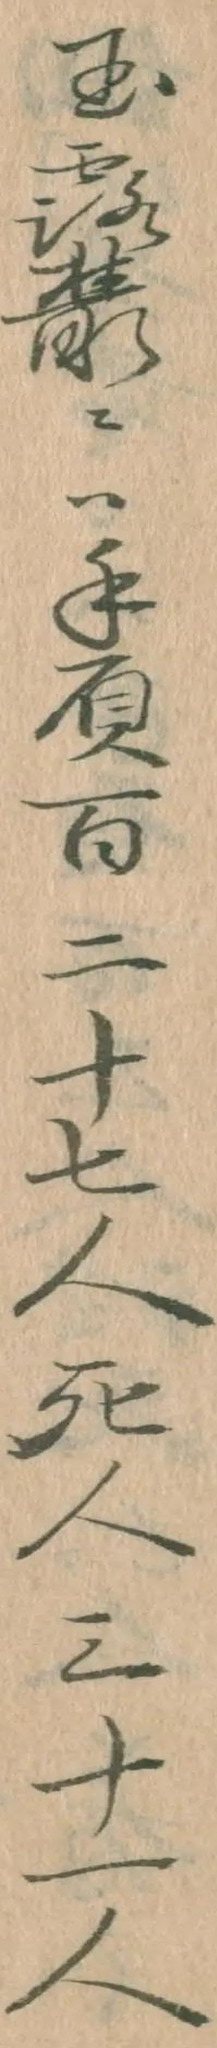玉露樷には手負百二十七人死人三十一人
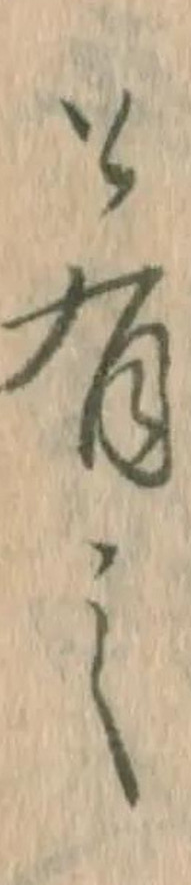と有之
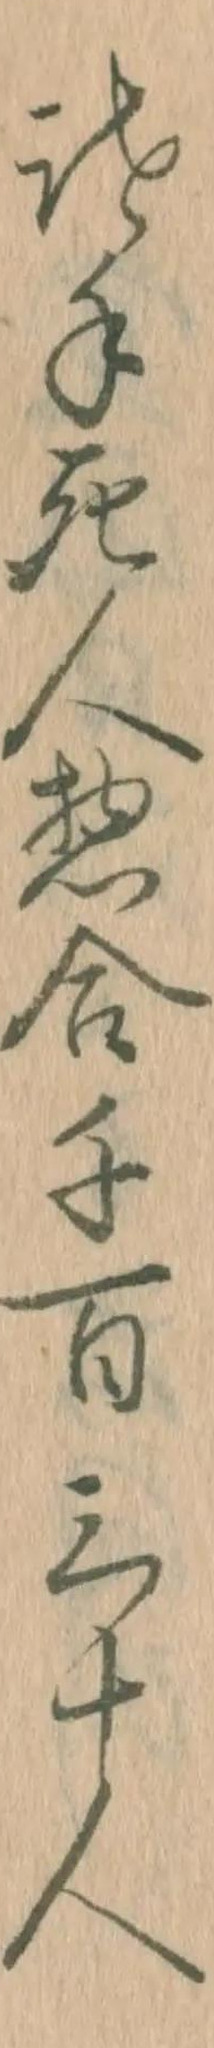諸手死人惣合千百三十人
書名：切支丹御退治記 49巻. [9]
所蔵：国立国会図書館 National Diet Library, JAPAN
